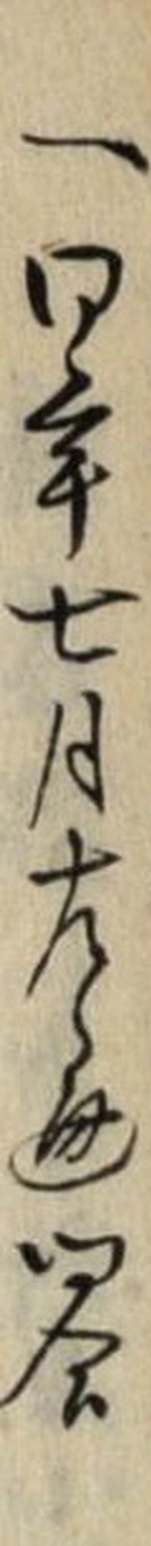一同年七月左之通問合
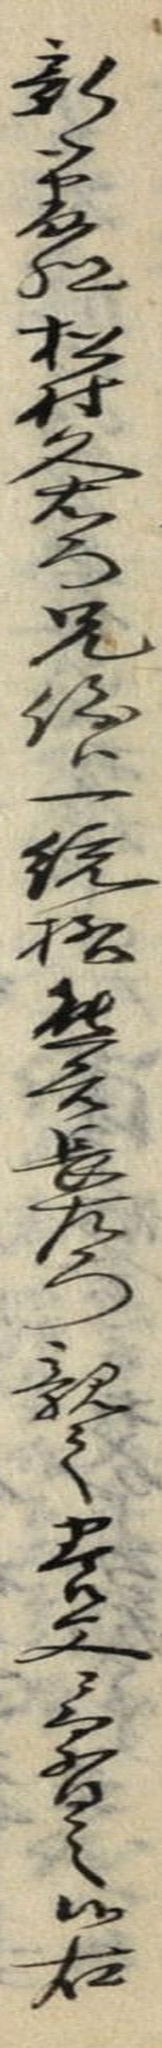新御番組松村久右衛門兄儀ハ一統格熊谷長左衛門親之養父ニ而有之候右
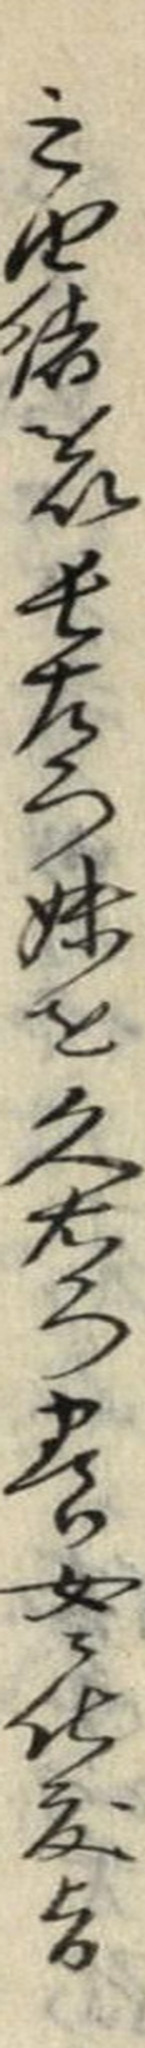之由緒を以長左衛門妹を久右衛門養女ニ仕度旨
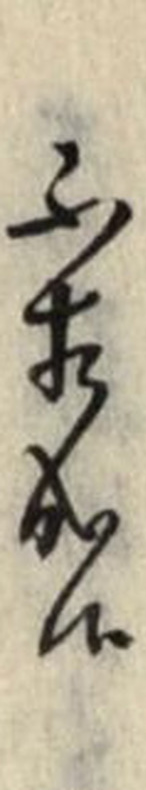不相成候
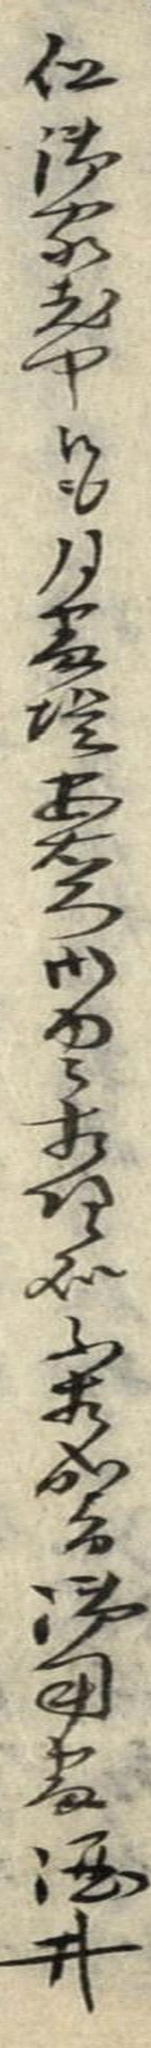但御家老中へも月番堤安右衛門御内々相伺候処不相成旨御用番酒井
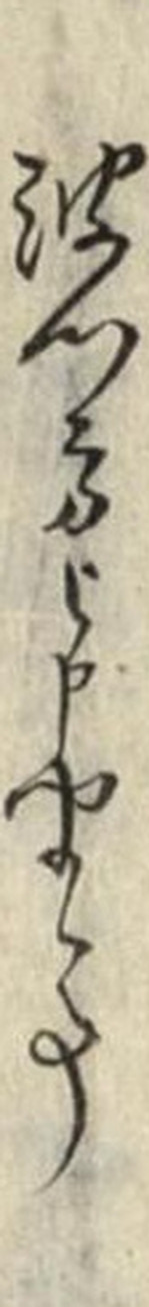波門方被申聞候事
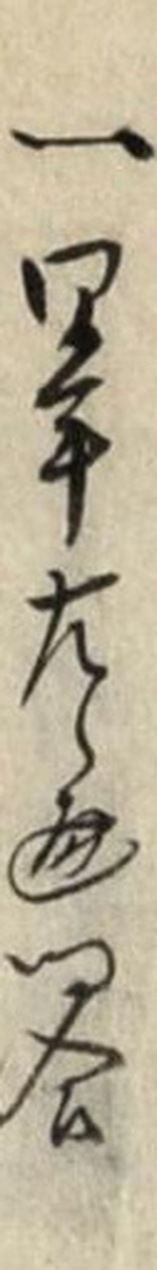一同年左之通問合
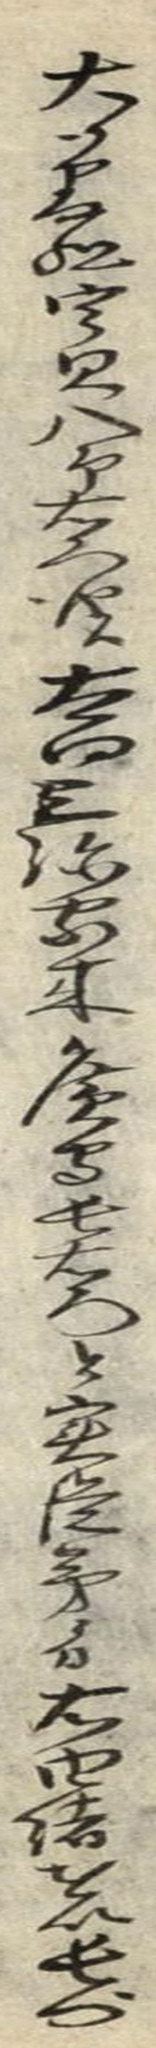大御番組宇貝八郎右衛門儀ハ太田三弥家来広守長右衛門と実従弟ニ付右由緒を以長右衛門
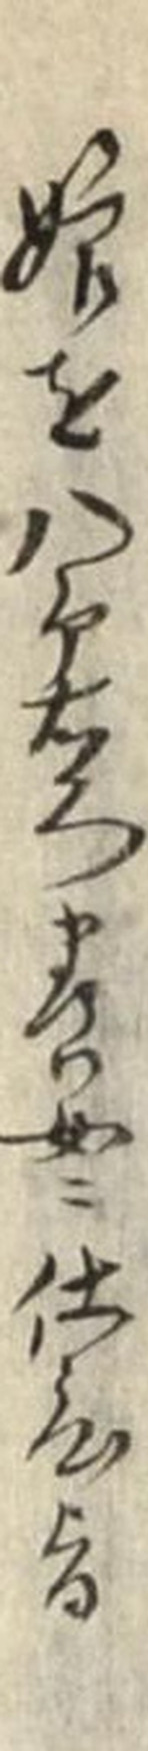娘を八郎右衛門養女ニ仕度旨
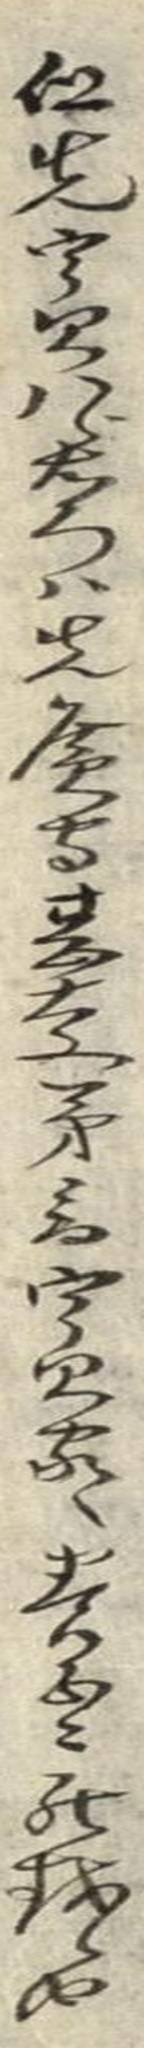但先宇貝八郎右衛門ハ先広守甚太夫弟ニ而宇貝家へ養子ニ罷越候由
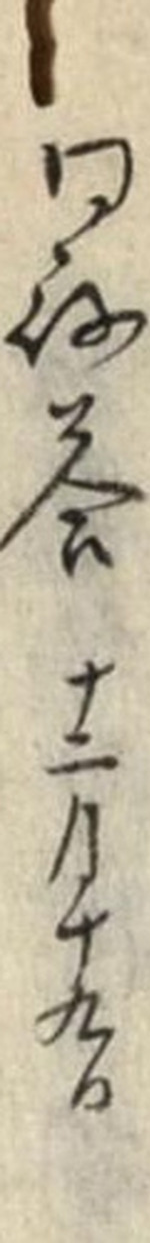同役答十二月十九日
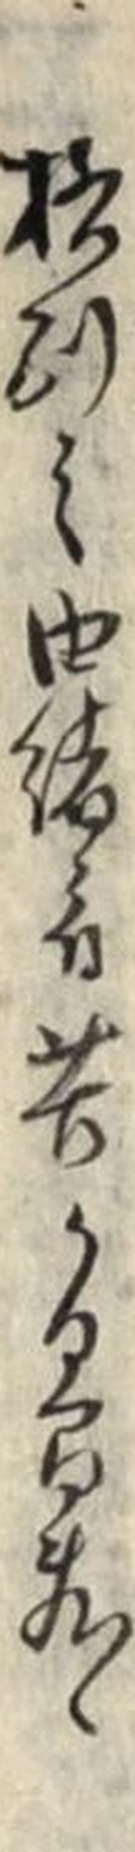格別之由緒ニ付苦かる間敷候
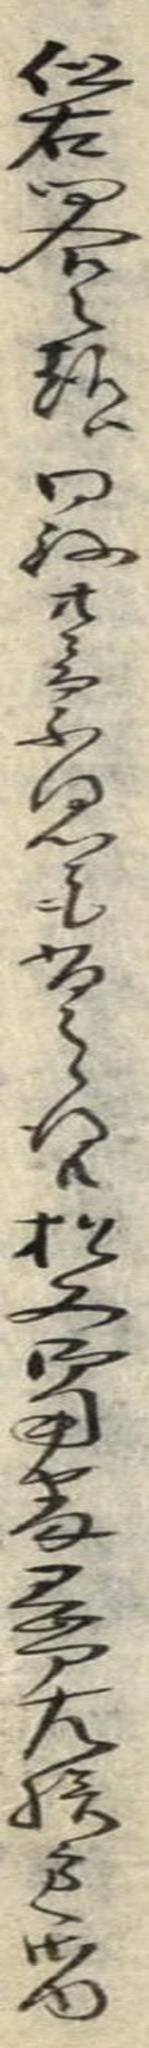但右問合之趣ハ同役共ニ而不同心とも有之候得ハ猶又御用番岡部左膳方へ御内
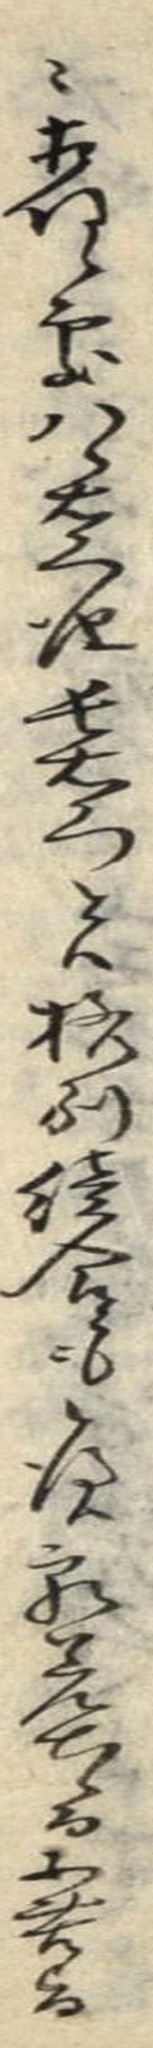々相伺候処八郎右衛門儀長右衛門とハ格別続合ニも候得ハ願差出候而不苦旨

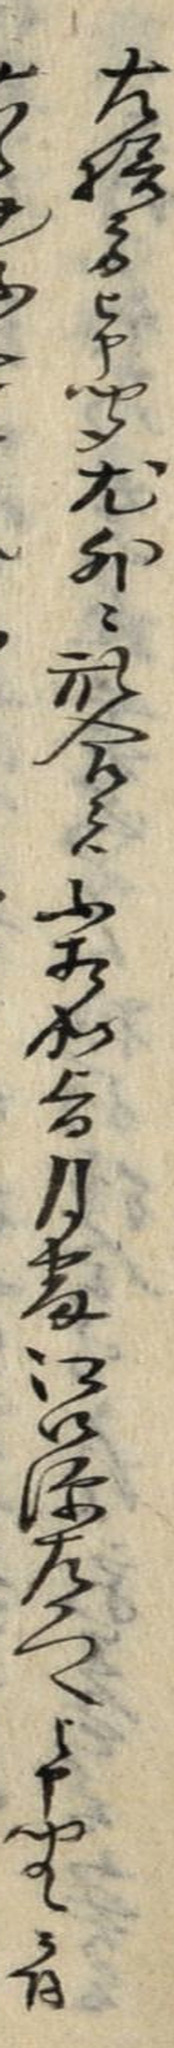左膳方被申聞尤外ニ形合ニハ不相成旨月番江口源左衛門へ被申聞候ニ付
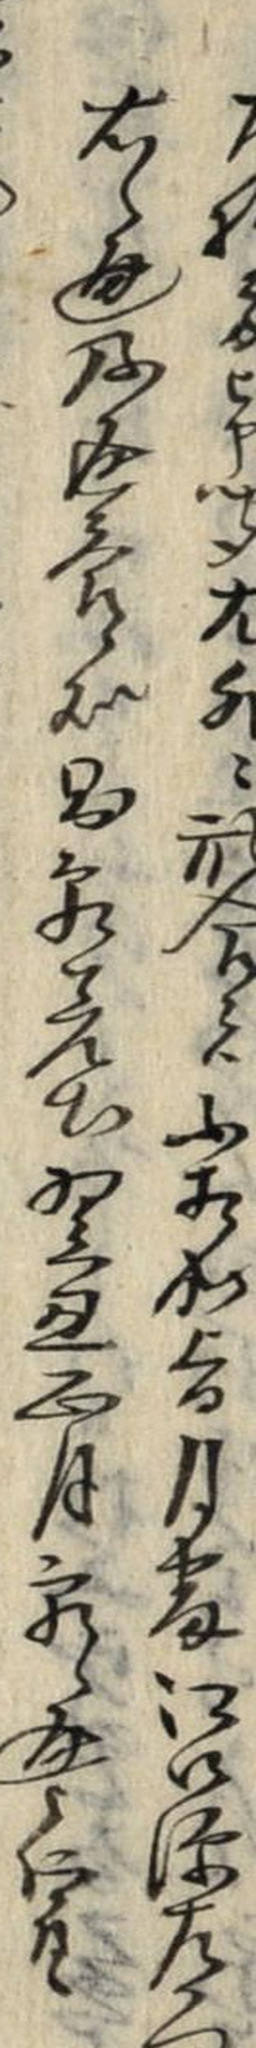右之通及返答候処則願差出翌丑正月願之通被仰付候
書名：養子縁組之部
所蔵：福井県文書館 Fukui Prefectural Archives
